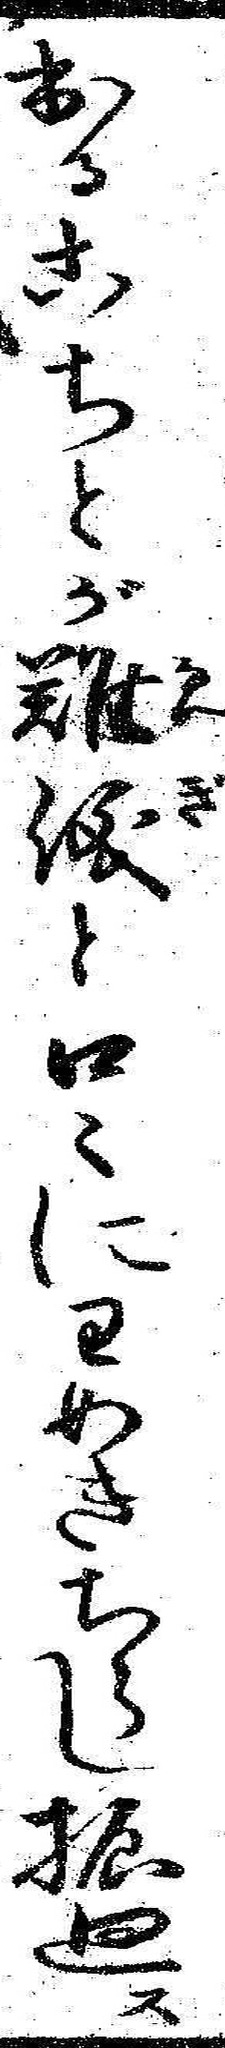出るこちとが難儀と口々にわめきちらし振廻

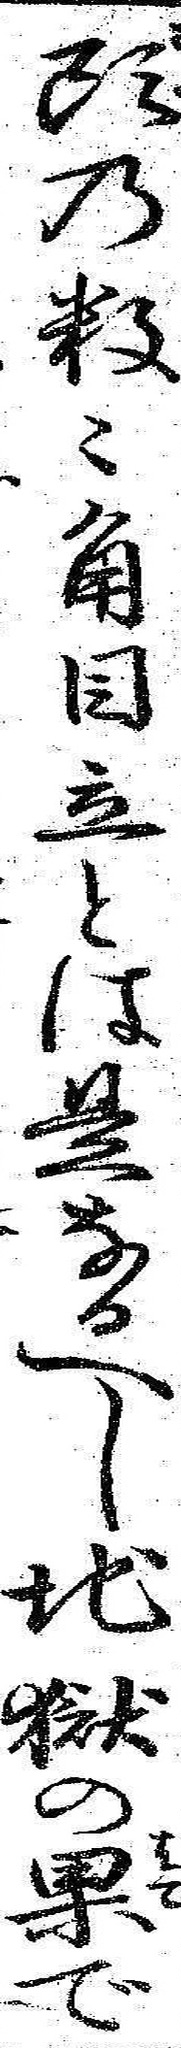頭の数々角目立とは是なるへし地獄の果で
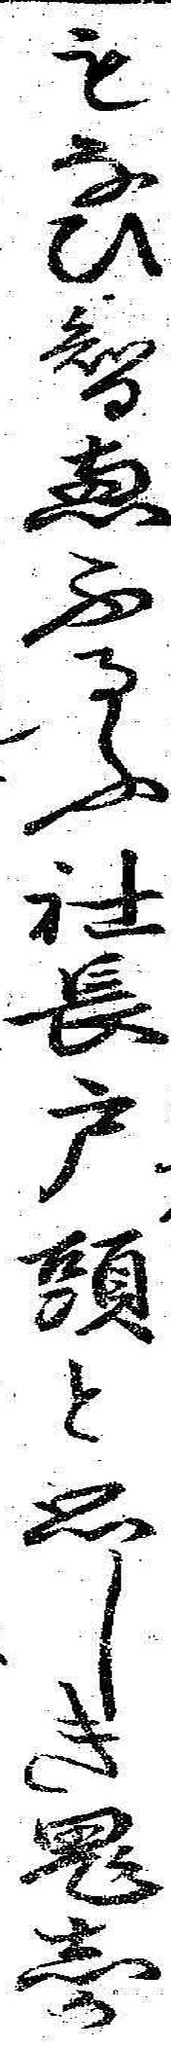もなひ智恵ふるふ社長戸頭と思しき鬼しか
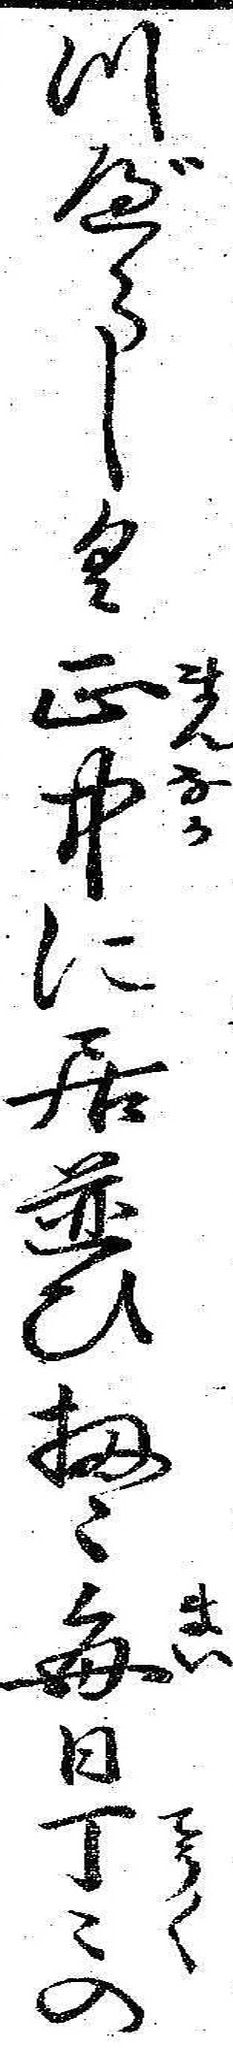つべらしく正中に居並ひ扨々毎日丁々の
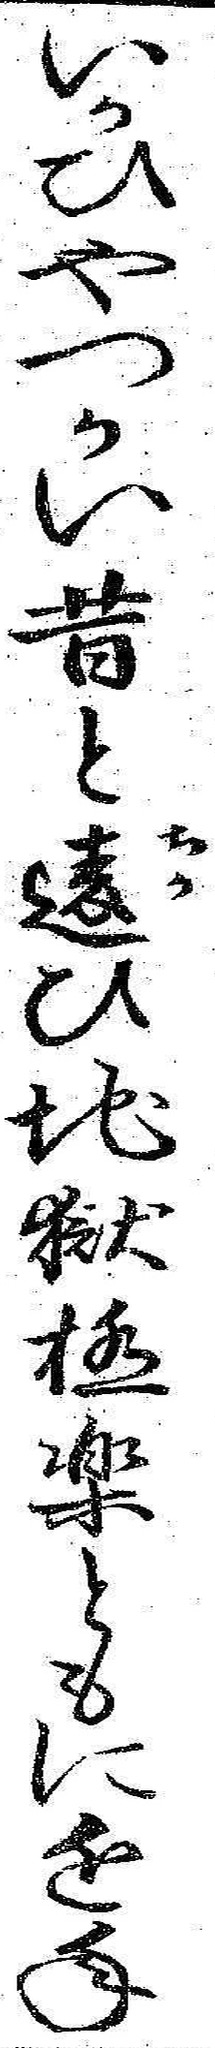いかひやつかい昔と違ひ地獄極楽ともに近年
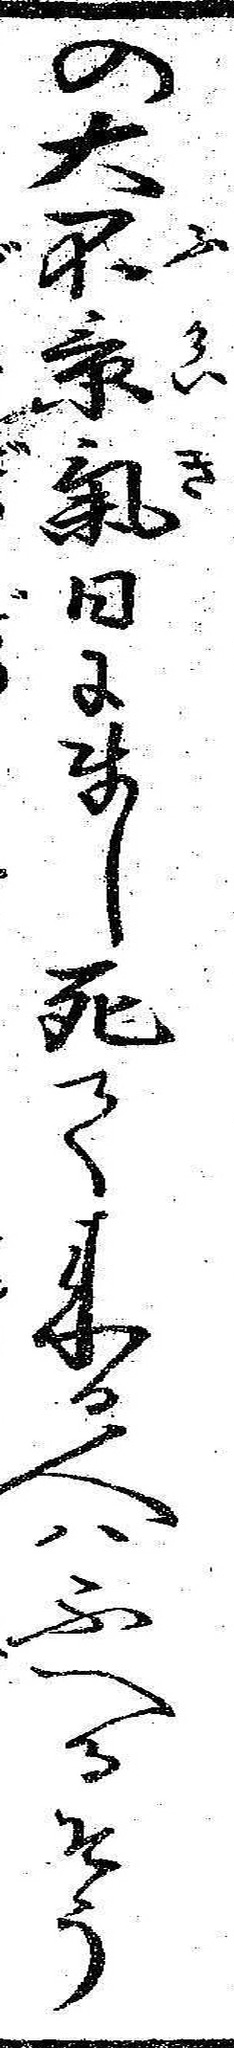の大不景気日にまし死て来る人はふへるそう
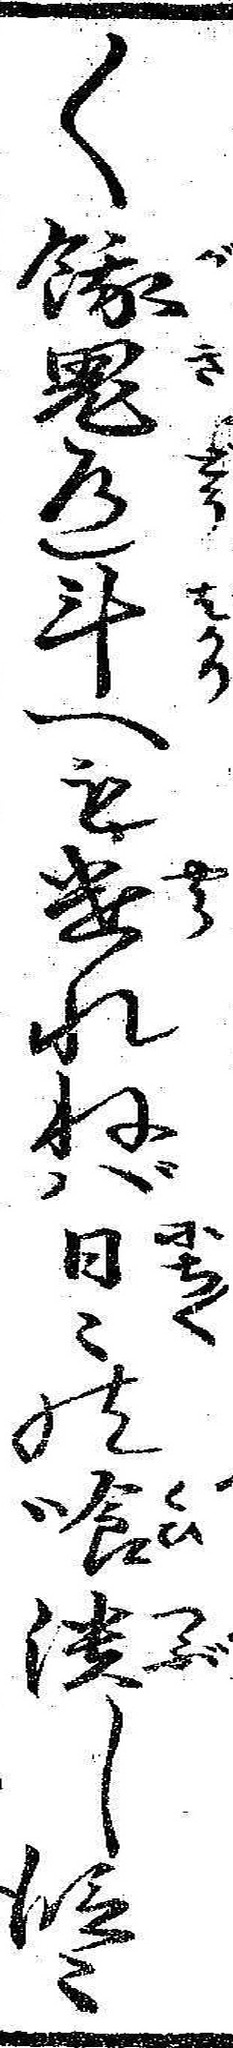〱縁鬼道斗へも遣れねば日々の喰潰し段々
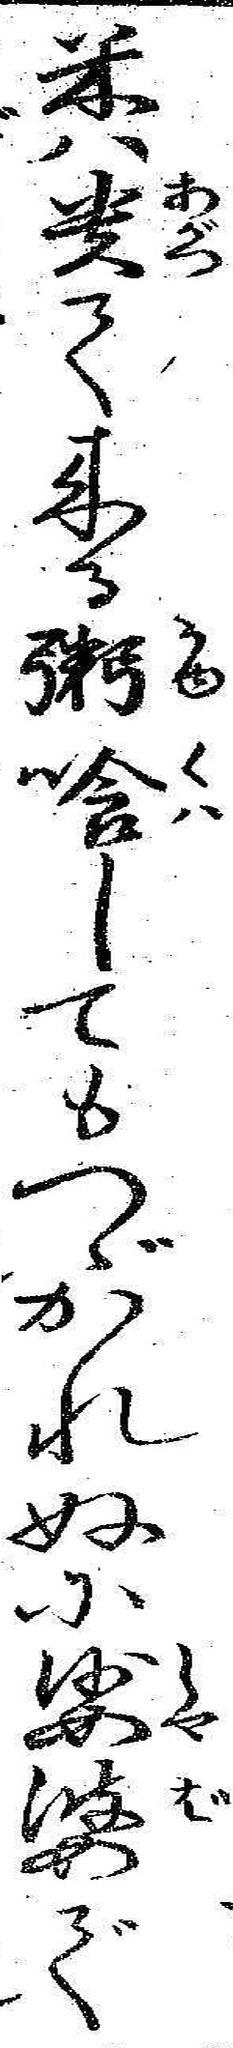米は貴て来る粥喰してもつゞかれぬに娑婆で
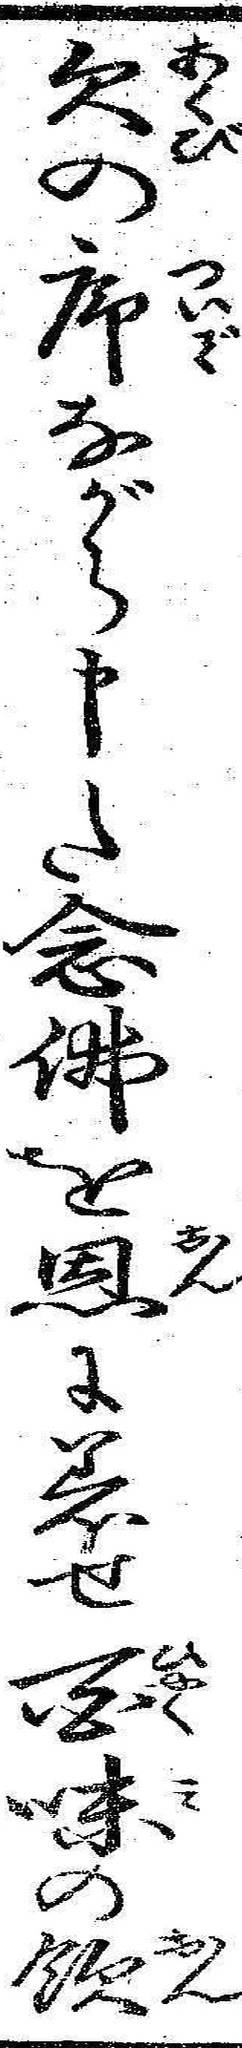欠の序ながら申した念仏を恩に着せ百味の飲
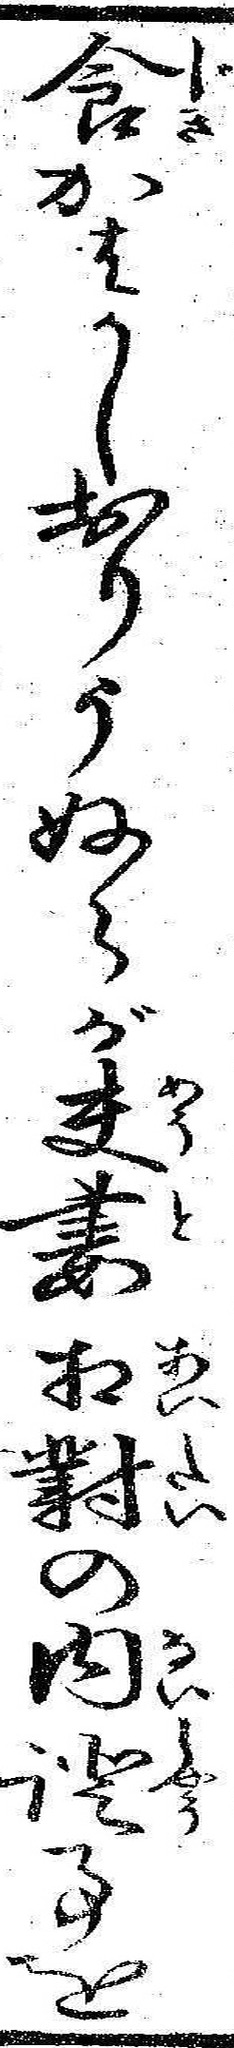食かはかしおりうぬらが夫妻相対の内証事を
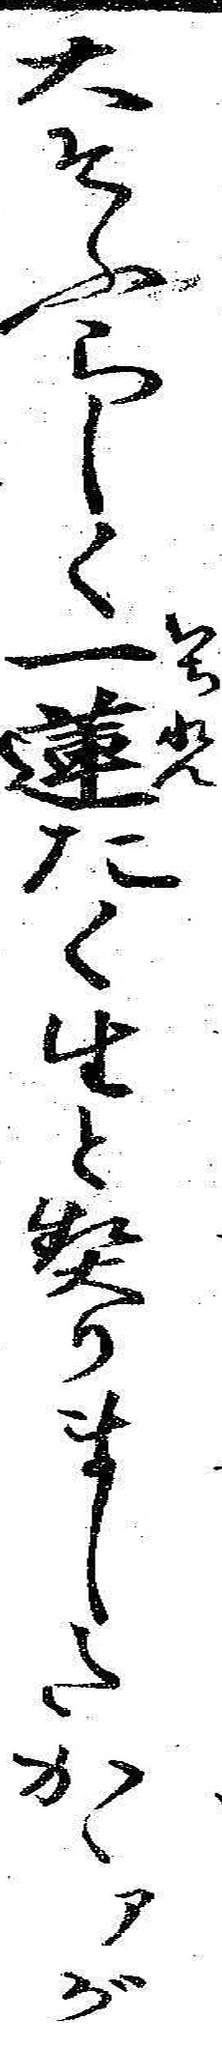大そふらしく一蓮たく生と契りましたかゝアが
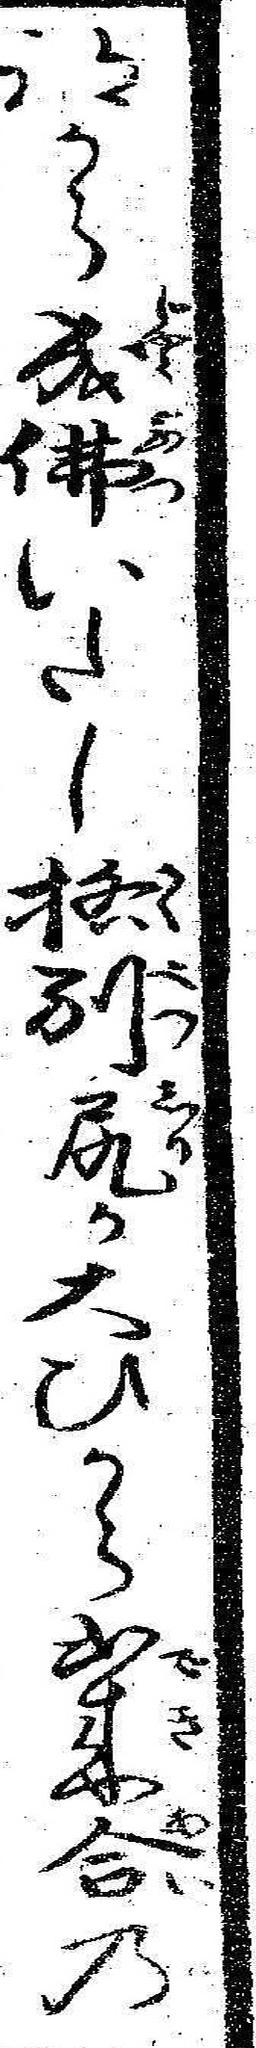跡から成仏いたし格別尻か大ひから出来合の
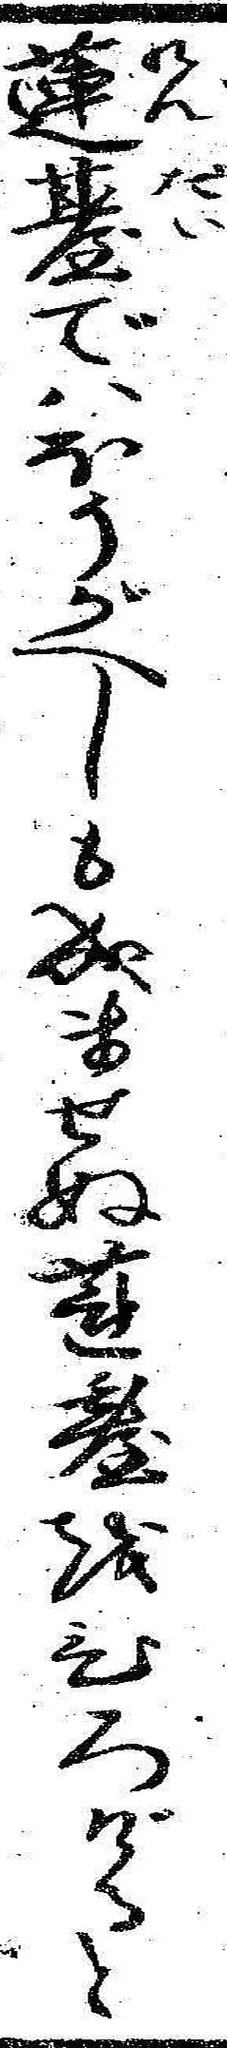蓮台ではほうがへしも成ませぬ蓮台をひろげると
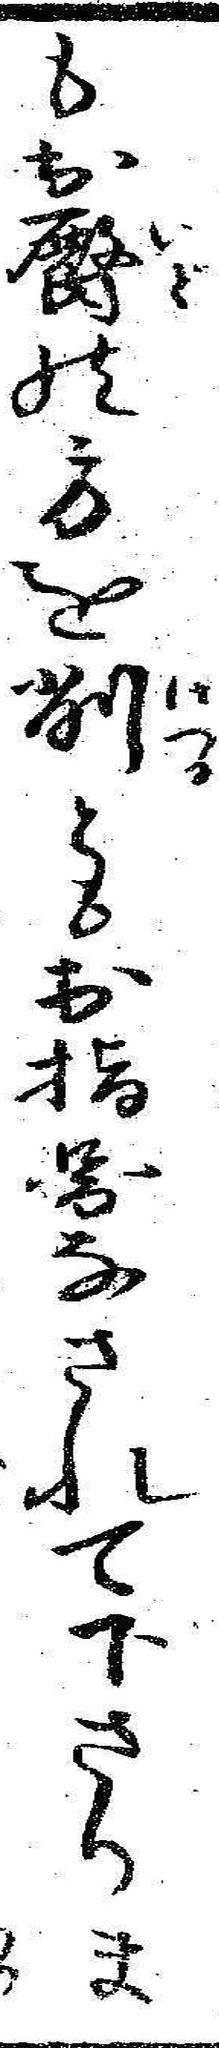もお臀の方を削ともお指図なされて下さりま
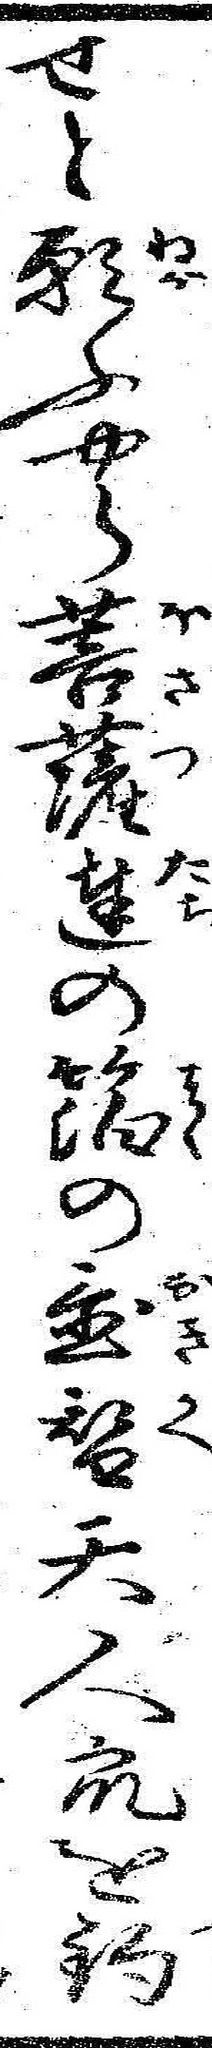せと願ふやら菩薩達の箔の置替天人衆を釣
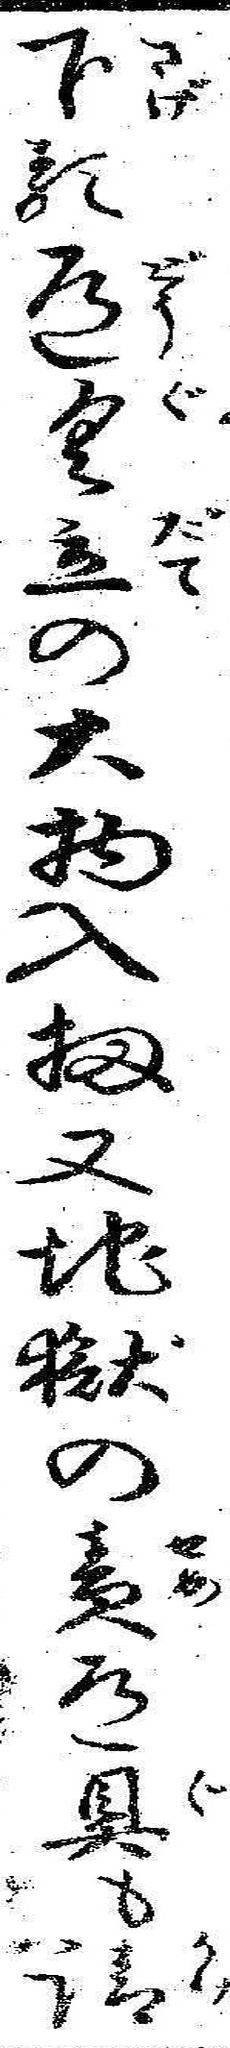下る道具立の大物入物又地獄の責道具も請
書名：根無草後編
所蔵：国文学研究資料館
